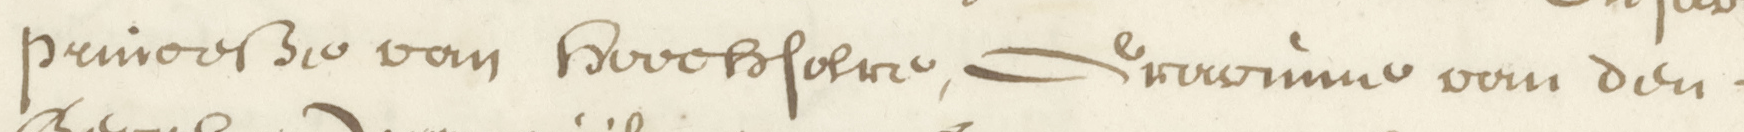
princesse van Hoochsolre, Gravinne van den
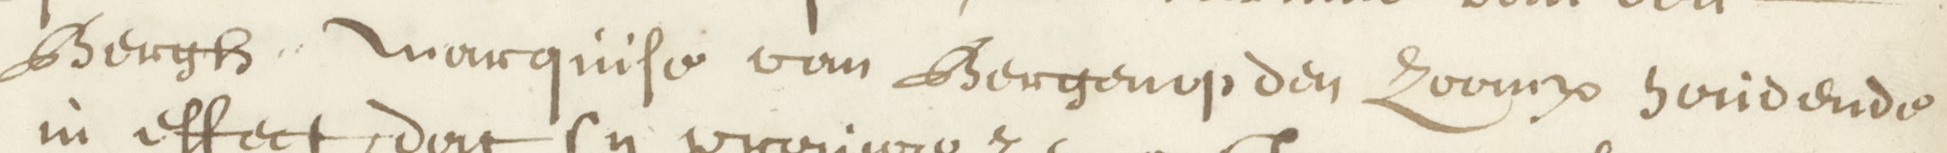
Bergh, Marquise van Bergen op den Zoom @ houdende
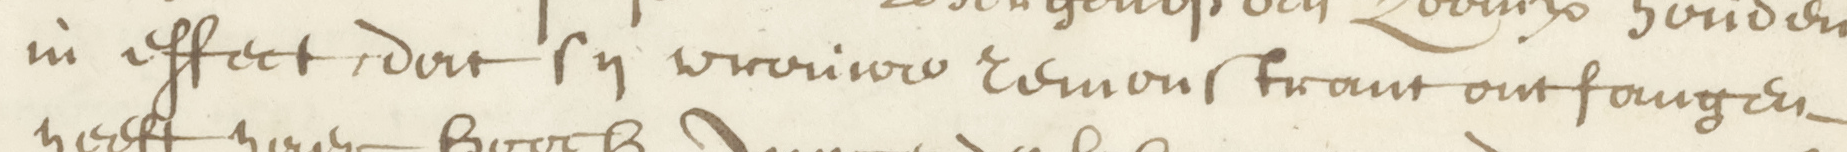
in effect, dat sy vrouwe remonstrant ontfangen
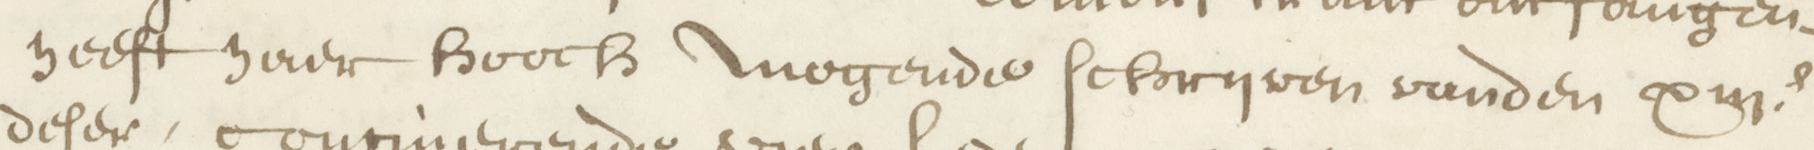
heeft haer Hooch Mogende schryven vanden xiije.
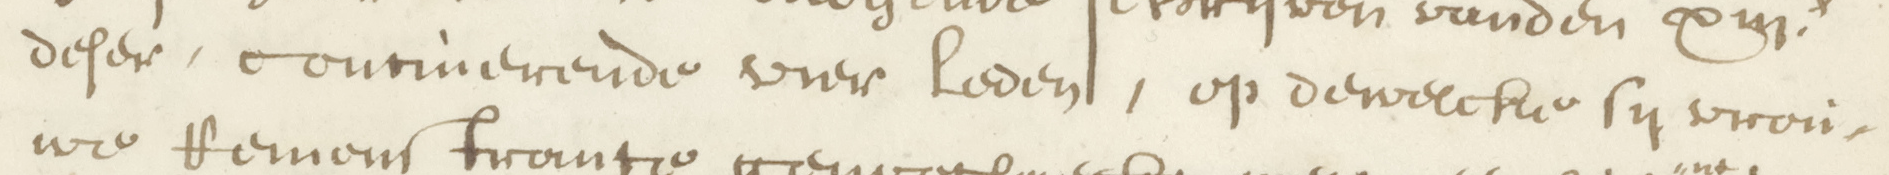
deser, continerende vier leden, op dewelcke sy vrou„
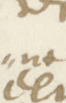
,,nt
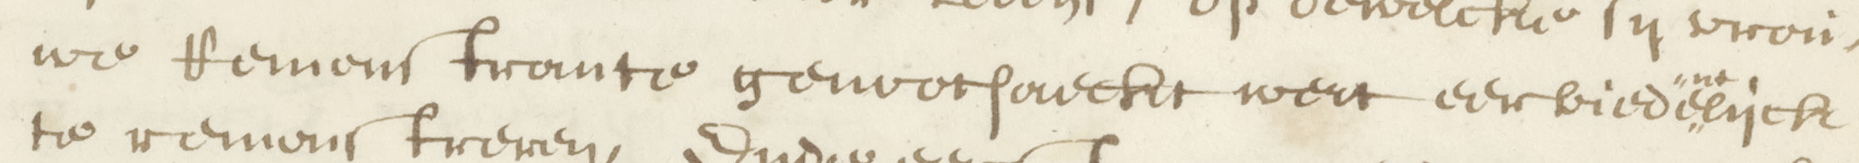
we Remonstrante genootsaeckt wert eerbiede,,lijck
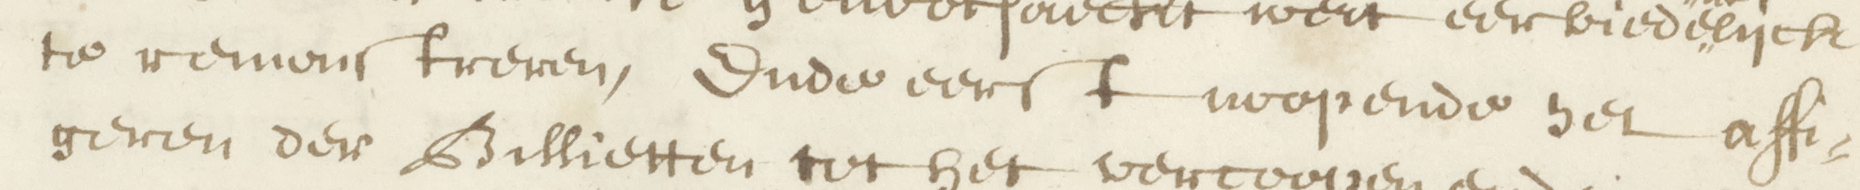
te remonstreren. Ende eerst noopende het affi„
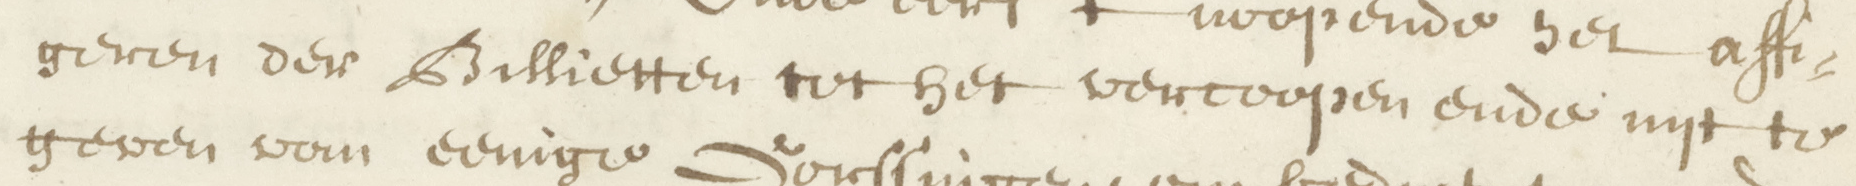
geren der Billietten tot het vercoopen ende uyt te
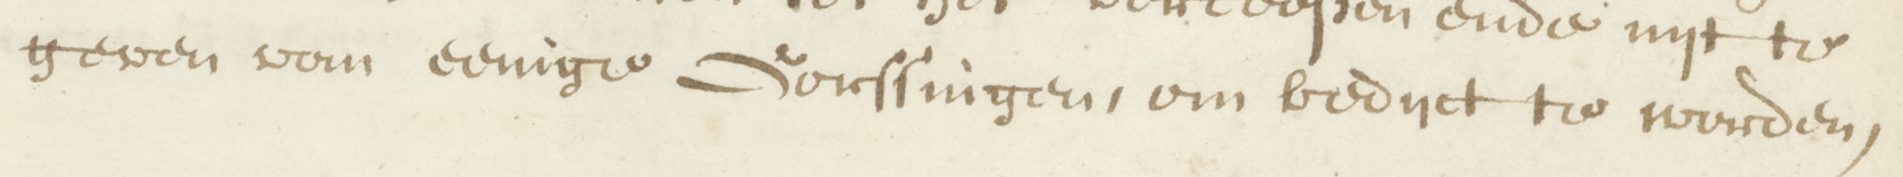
geven van eenige Gorssingen, om bedyct te worden,
